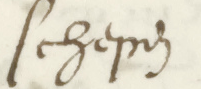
Schepen
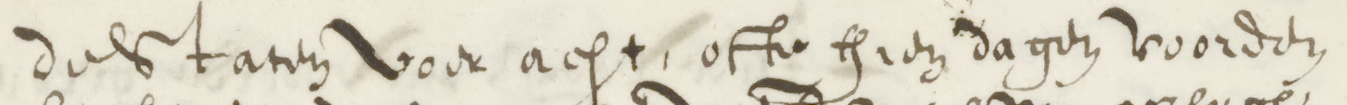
de Staten voor acht ofte thien dagen voorden
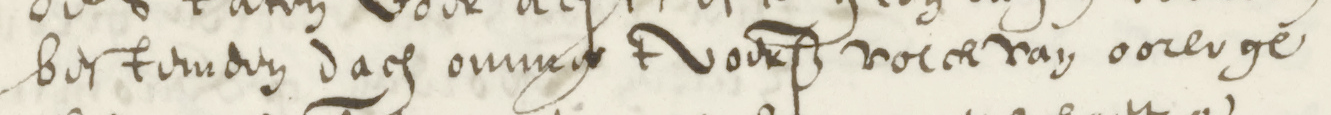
bestemden dach omme t voers volck van oorlogh
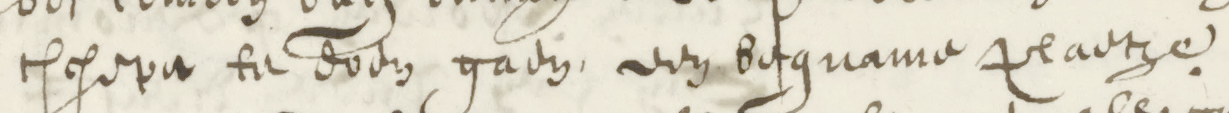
tschepe te doen gaen, een bequame plaetze
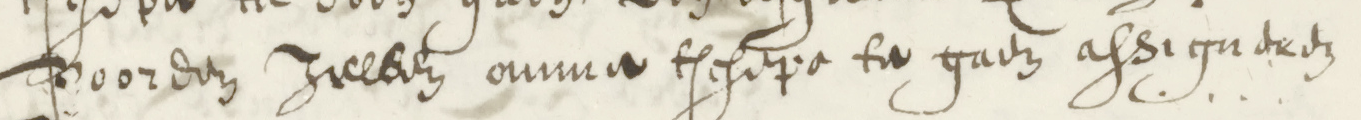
voorden zelven omme tschepe te gaen assigneren.
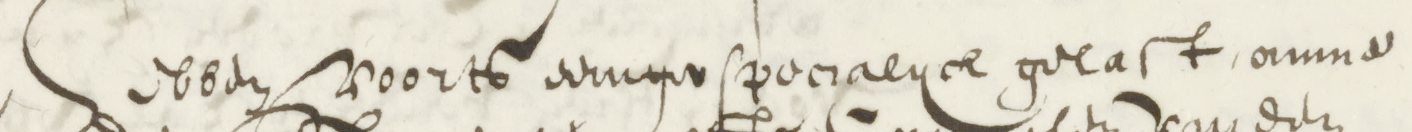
Hebben voorts eenige specialyck gelast omme
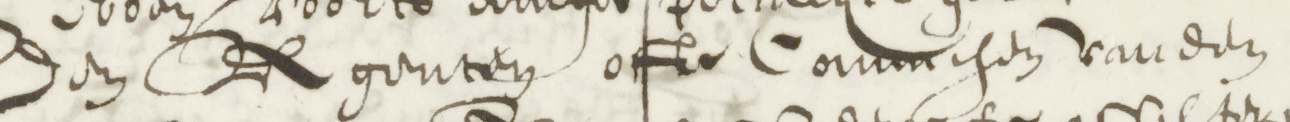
den Agenten ofte Commisen van den
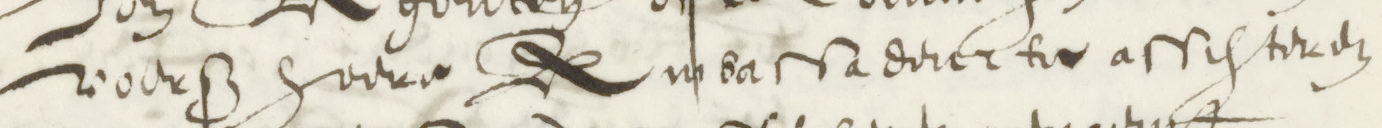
voers heere Ambassadeur te assisteren
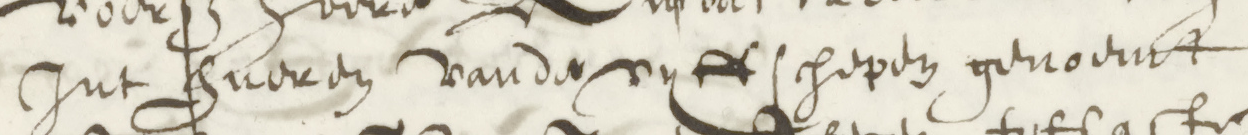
int hueren vande vijff scepen genoemt
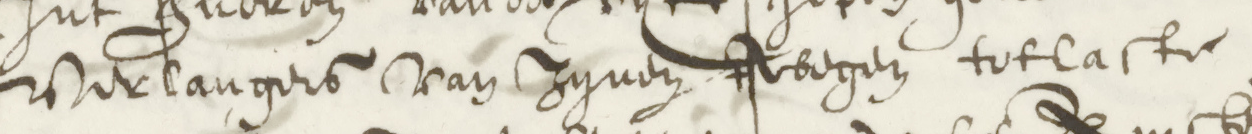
verlangers van zijnen twegen tot laste
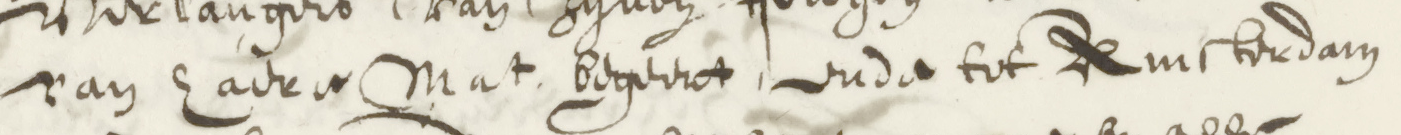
van haere Mat begeert, ende tot Amsterdam
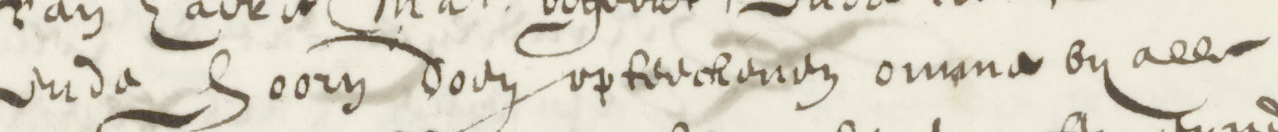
ende Hoorn doen opteeckenen omme bij alle
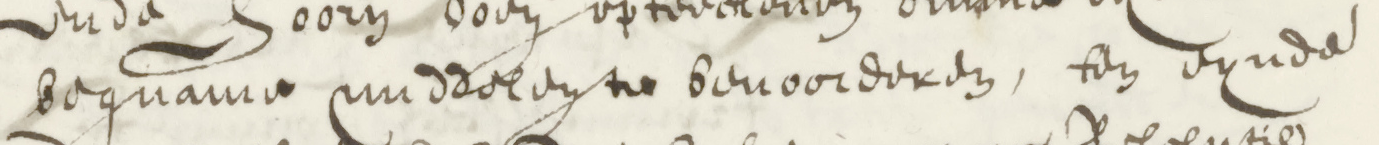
bequame middelen te bevoorderen, ten eynde
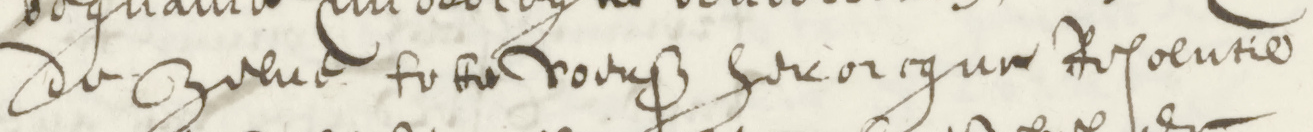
de zelve totte voers heroicque resolutie
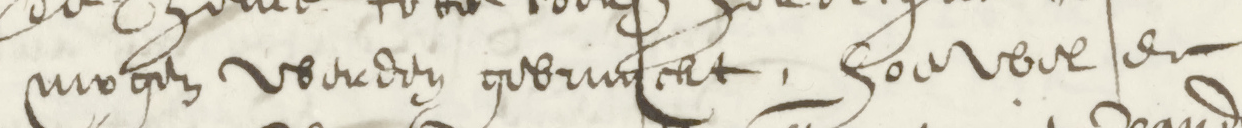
mogen werden gebruyckt, hoewel de
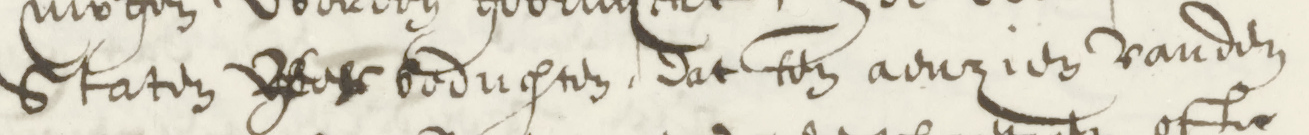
Staten wel beduchten, dat ten aenzien van den
